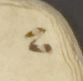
2
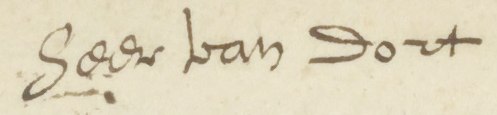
heer van Dort
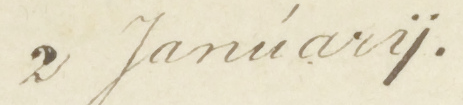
2 Januarij.
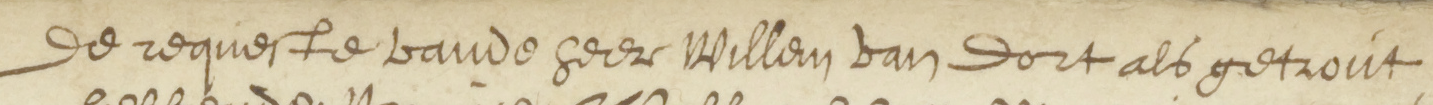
De requeste vande heer Willem van Dort als getrout
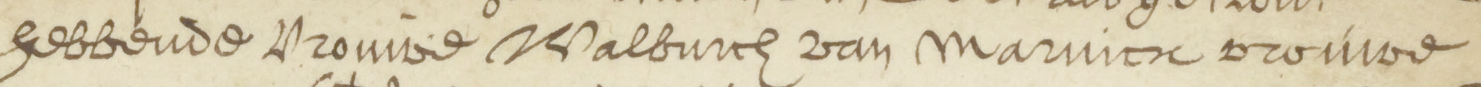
hebbende Vrouwe Walburch van Marnicx vrouwe
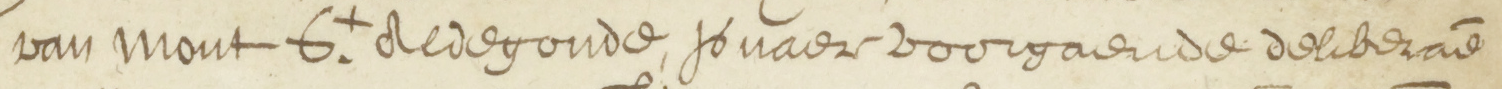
van Mont St. Aldegonde, Is naer voorgaende deliberae
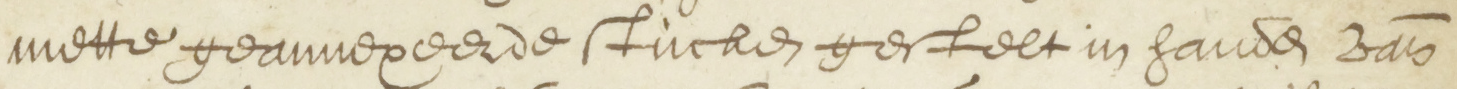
mette geannexeerde stucken gestelt in handen van
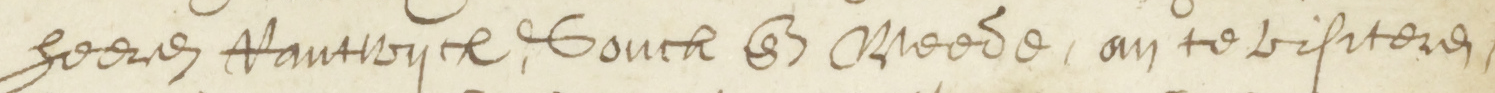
heeren Rantwyck, Sonck & Weede, om te visiteren,
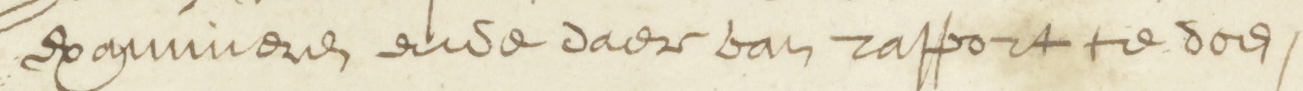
examinieren ende daer van rapport te doen.
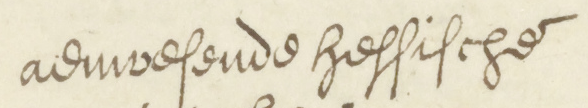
aenwesende hessische
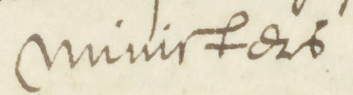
ministers
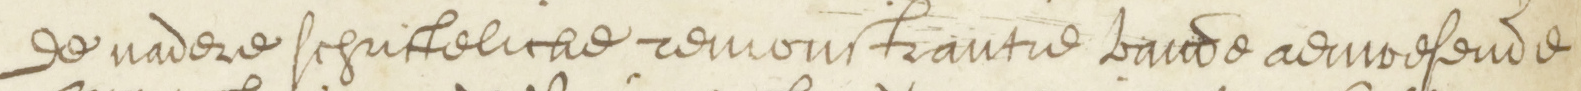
De nadere schriftelicke remonstrantie vande aenwesende
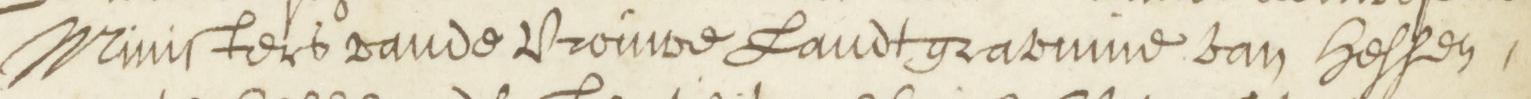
Ministers vande Vrouwe Landtgravinne van Hessen,
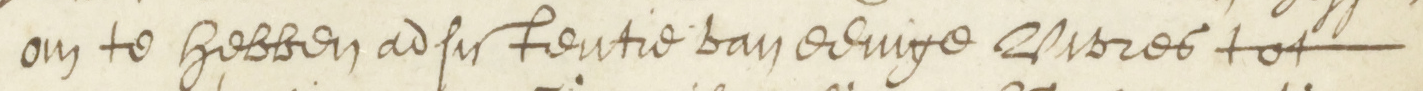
om te hebben adsistentie van eenige Vivres tot
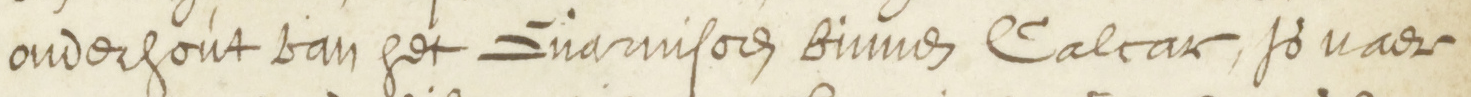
onderhout van het Guarnisoen binnen Calcar, Is naer
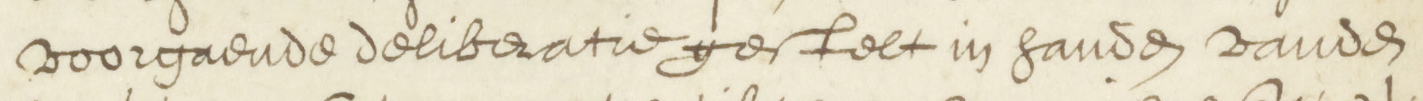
voorgaende deliberatie gestelt in handen vanden
